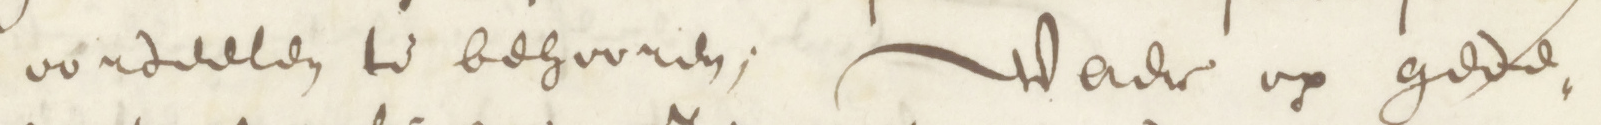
oordeelen te behooren; Waer op gede„
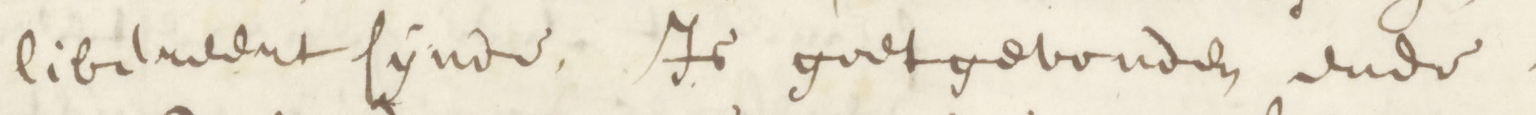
libereert sijnde, Is goetgevonden ende
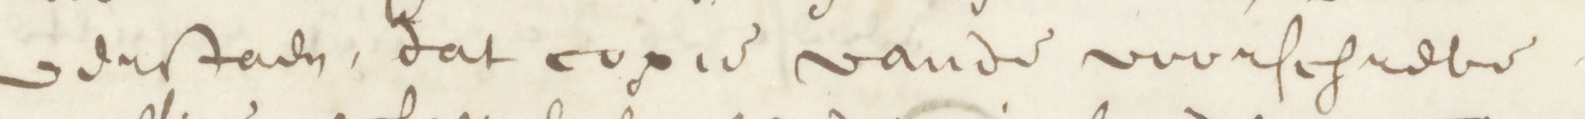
verstaen, dat copie vande voorschreve
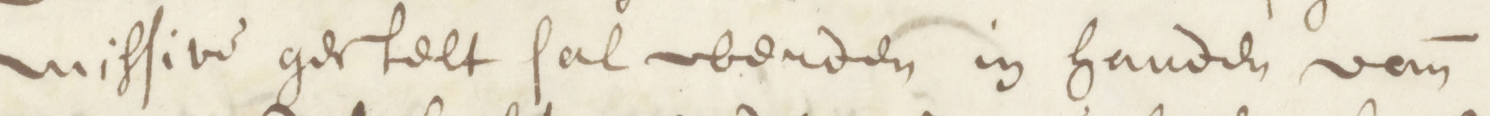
missive gestelt sal werden in handen van
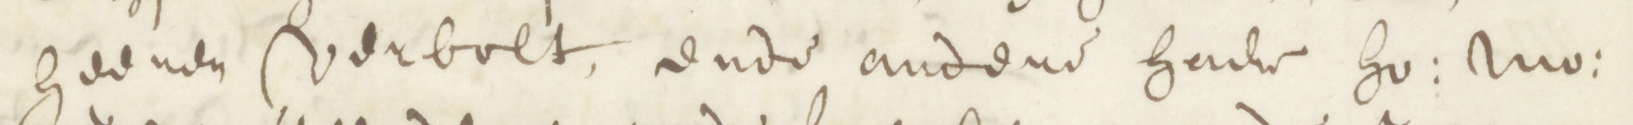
heeren Verbolt, ende andere haer ho:mo:
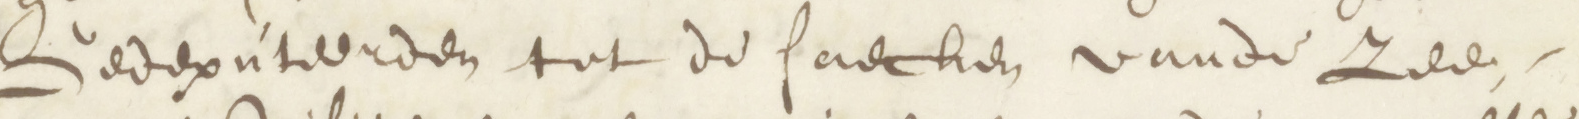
Gedeputeerden tot de saecken vande zee,
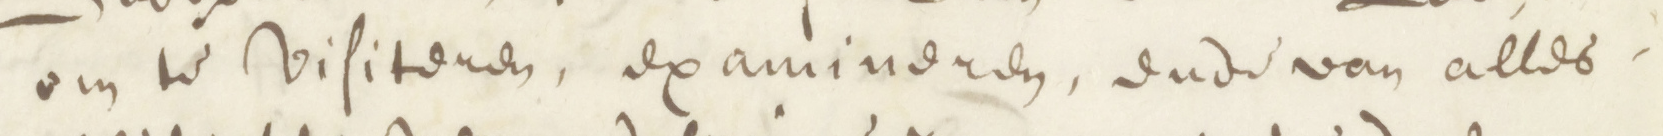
om te visiteren, examineren, ende van alles
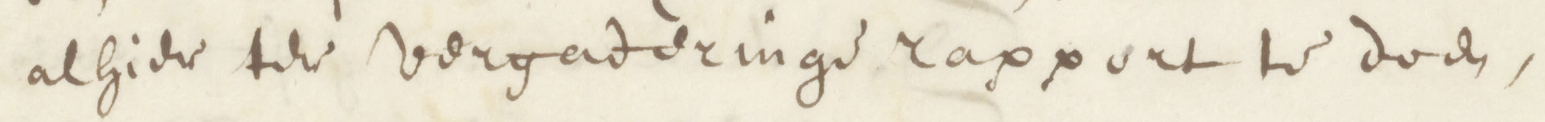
alhier ter vergaderinge rapport te doen.
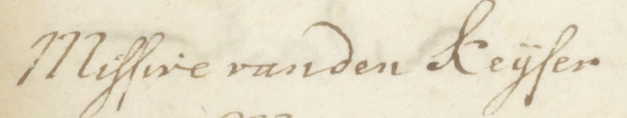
Missive van den Keijser
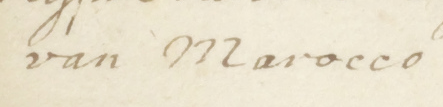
van Marocco
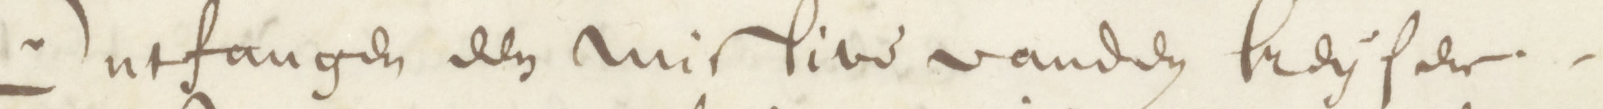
Ontfangen een missive vanden keijser
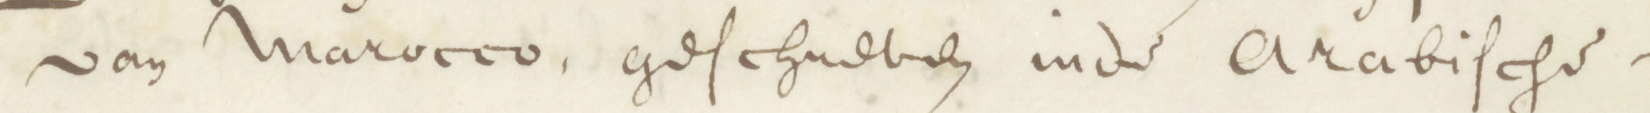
van marocco, geschreven inde Arabische
